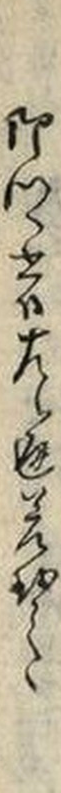御門へ書付左之通差越之候
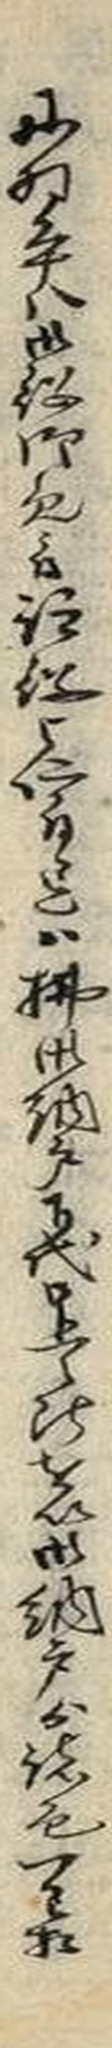丹羽平八御役御免に付跡役被仰付候迄は払御納戸下代口上之断を以御納戸ゟ諸色可被相
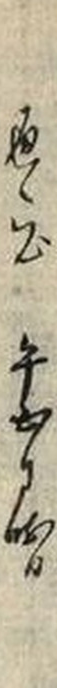通候以上午五月晦日
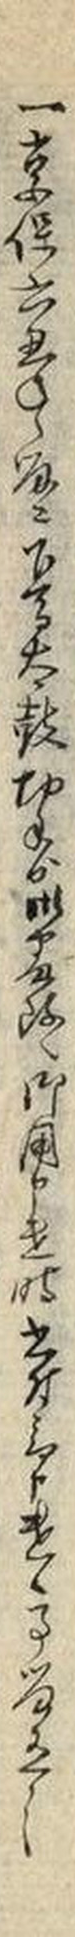一享保六丑年之留に下馬太鼓切手ゟ御番改へ御用申遣時書付に而申遣候事留有之
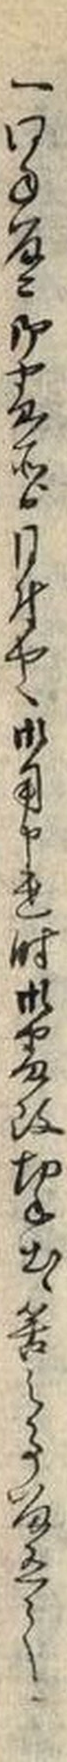一同年留に御番所ゟ目付中へ御用申遣時御番改切手出候筈之事留有之
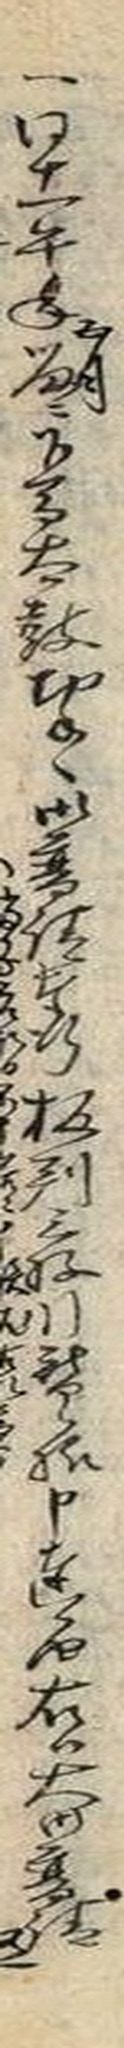一同十一午年正月留に下馬太鼓切手へ御普請奉行板判三枚引替候様申達候由右は大御普請有
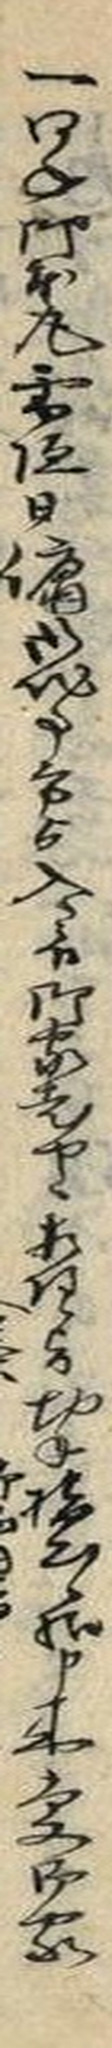一同年御本丸雪垣日傭御作事方ゟ入候に付御家老中へ相伺候旨切手指出候様申来尚又御家

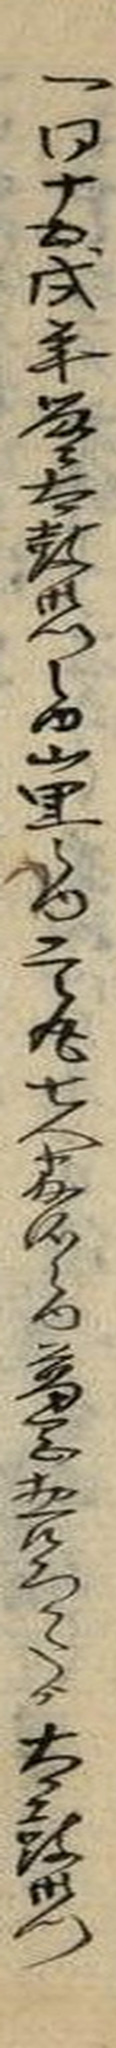一同十五戌年留に太鼓御門之内山里御門二之丸七人番所之内葛巻惣左衛門かたゟ太鼓御門
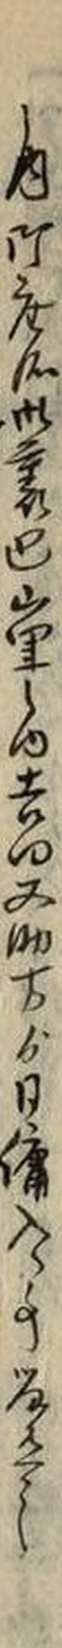之内御座所御裏廻山里之内吉田又助方ゟ日傭入候事留有之
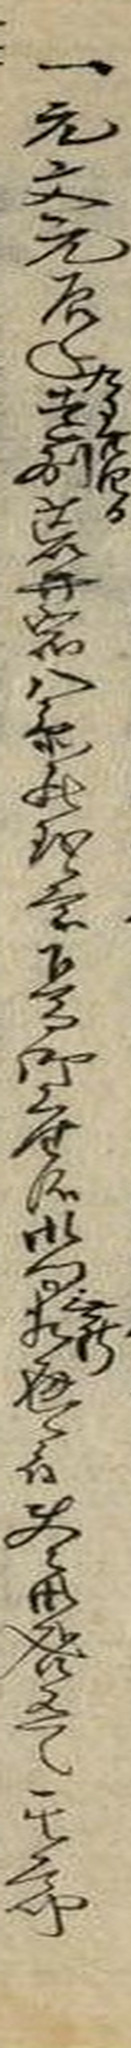一元文元辰年九月廿四日遠州荒井宿八兵衛罷越候節下馬御座所御門無断相通候に付夫々御咎有之其節
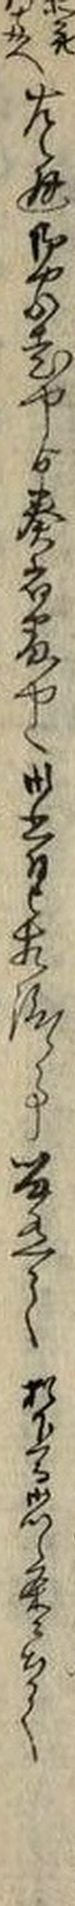左之通御家老中ゟ奏者番中へ御書付被相渡候事留有之猶下馬御門之条に出之
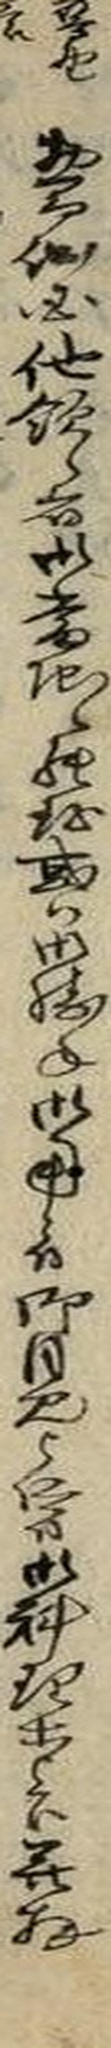惣而他国他領之者御当地へ罷越或は御勝手御用に付御目見被仰付御料理等被下并拝
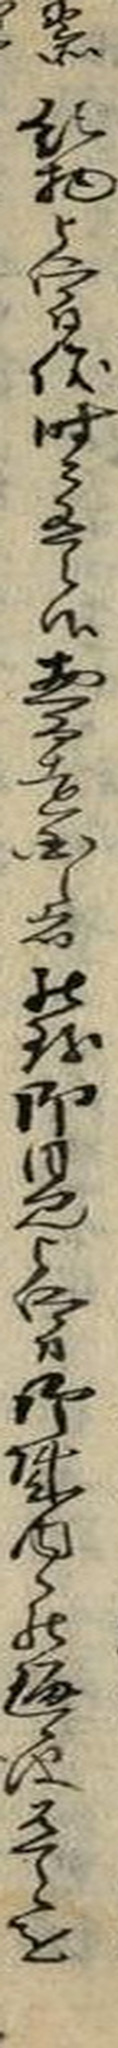領物被仰付儀時々有之候惣而遠国之者罷越御目見被仰付御城内へ罷通候儀有之を
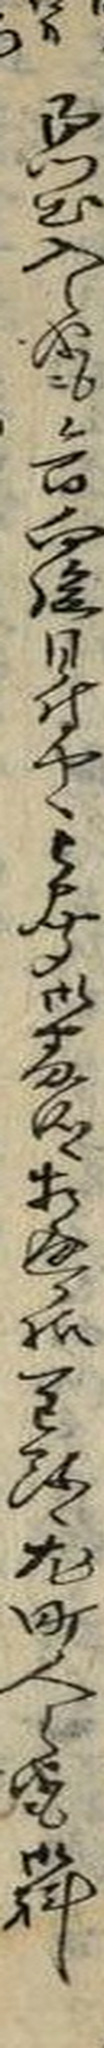御門出入之儀も候間向後目付中へ被申聞御番所へ相通候様可被致候尤町人之儀も御料
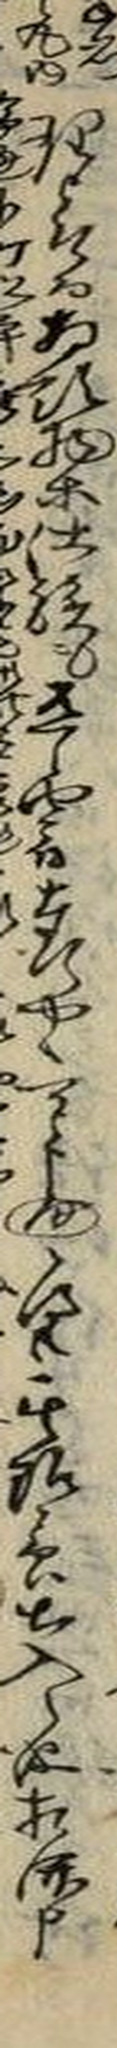理被下候而拝領物等仕族も有之由に付奉行中へ可被申通候得共其趣に而は出入之儀相済申
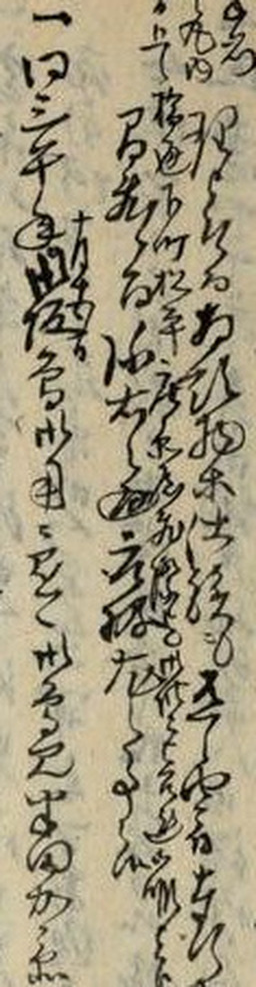間敷候間弥右之通取扱尤之事に候
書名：御門御櫓之部
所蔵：福井県文書館 Fukui Prefectural Archives
